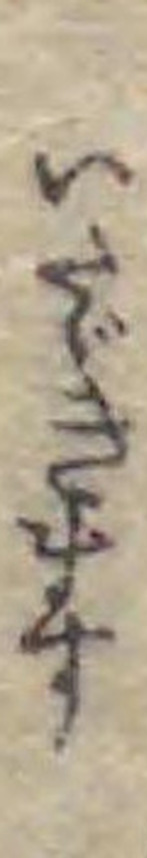いたゞきます
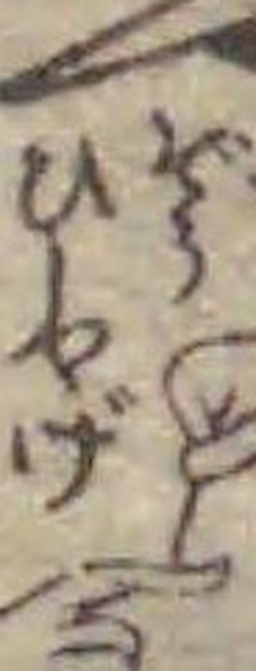ひしやげ
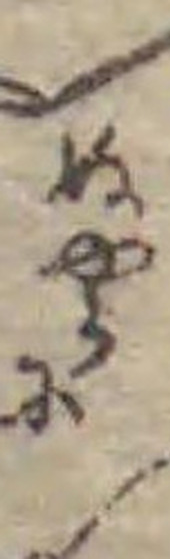ぬやうに
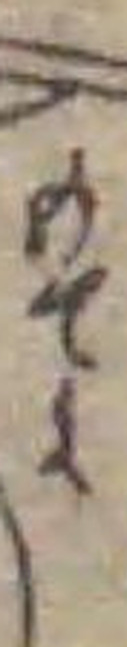もてよ

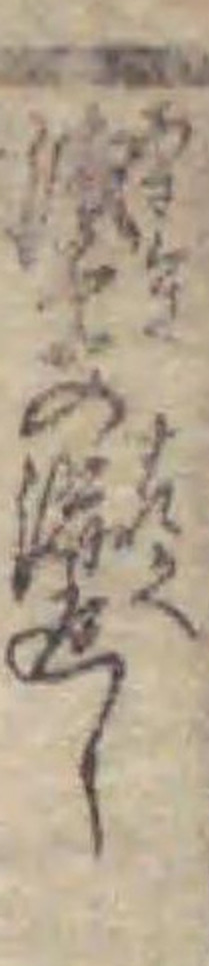浅草の漉返し
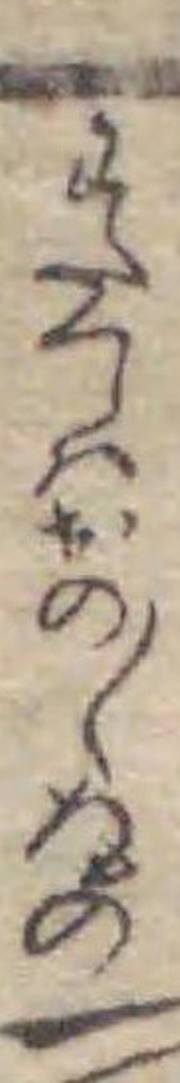わたくしはおの〳〵様の
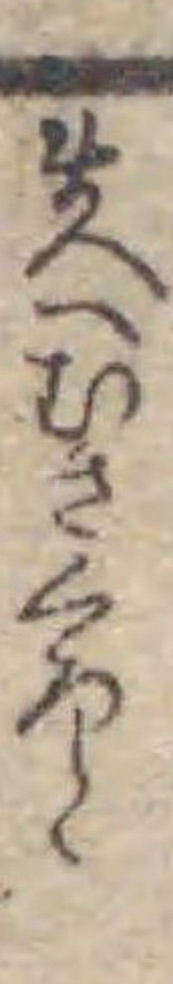まへへむさくろしく
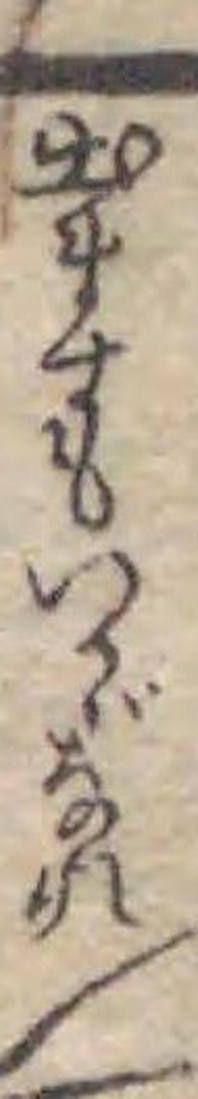出ますもいかゞなれ
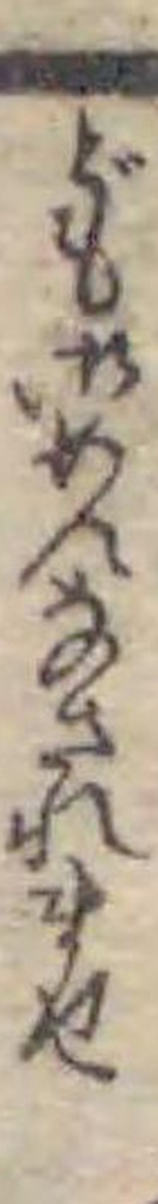ども御めんなされませ
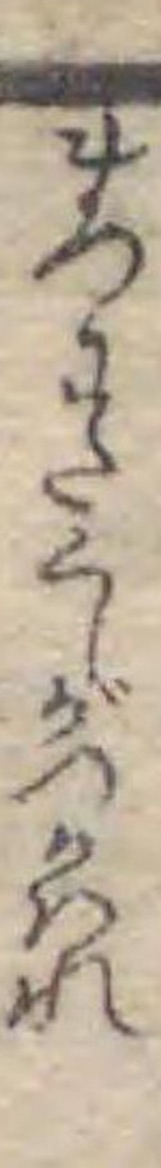まつわたくしがつかはれ
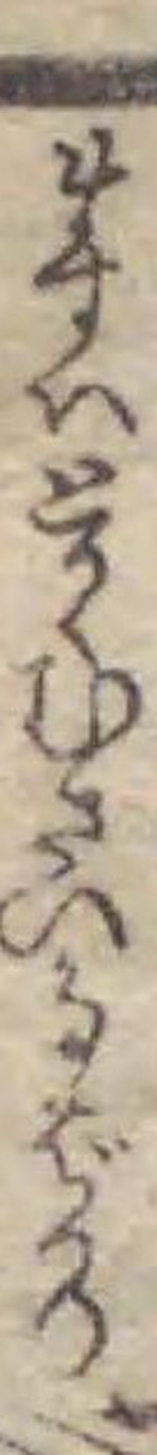ますはとかくむさい事ばかり
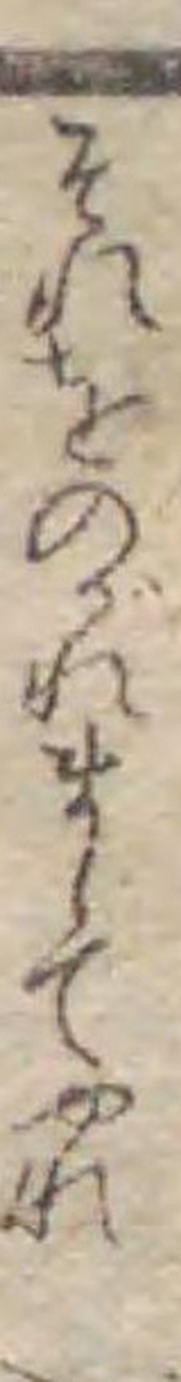それをのがれましてやれ
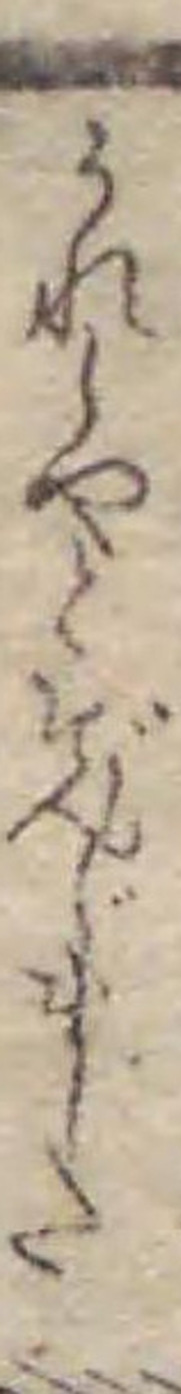うれしやとぞんじました
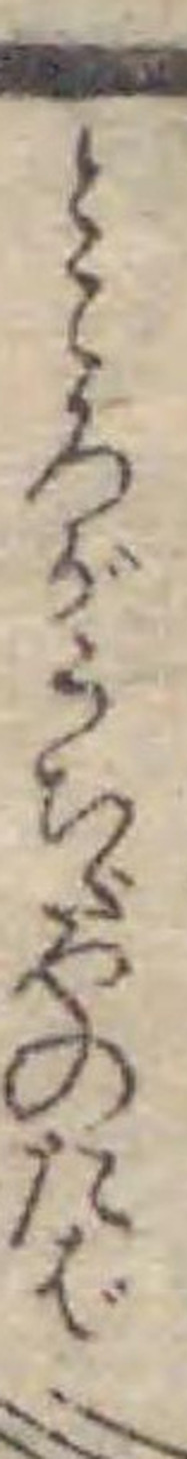ところがうちだやのたば
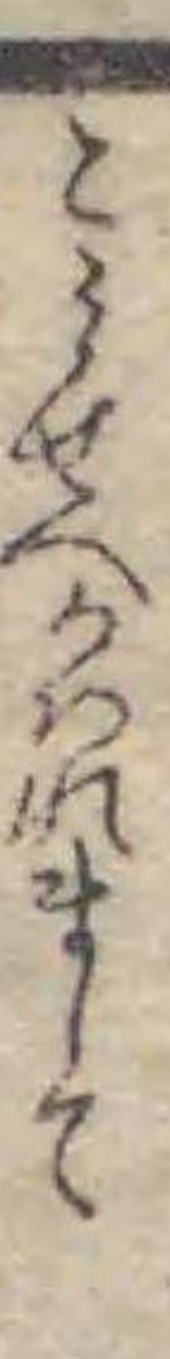こみせへかはれまして
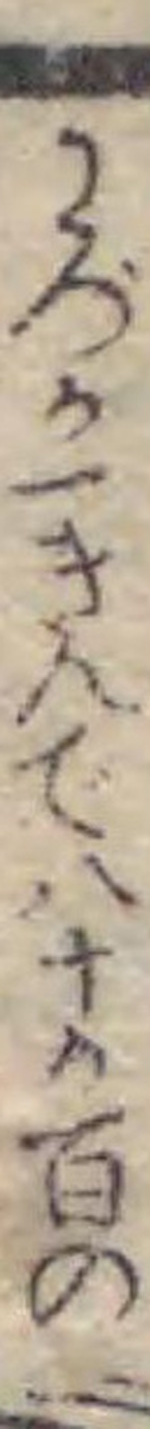わづか一きんで八十か百の
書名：紙屑身上噺 : 3巻
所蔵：国立国会図書館 National Diet Library, JAPAN
